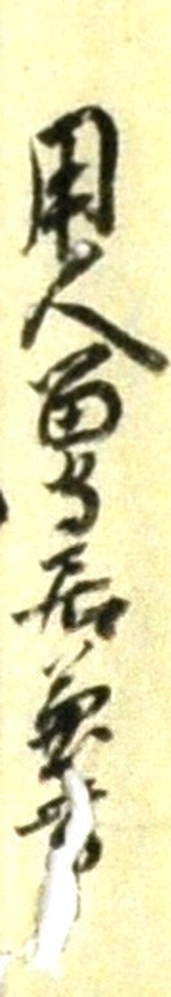用人留守居兼帯
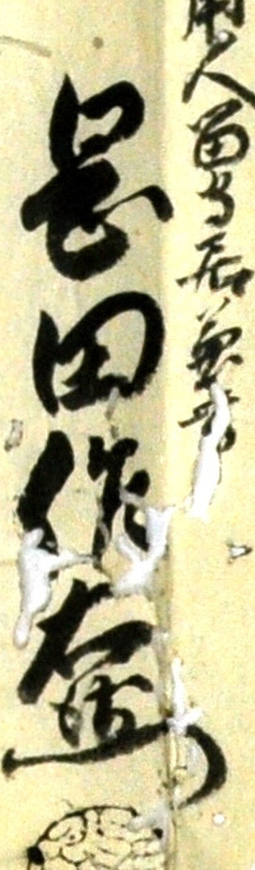岡田作右衛門㊞
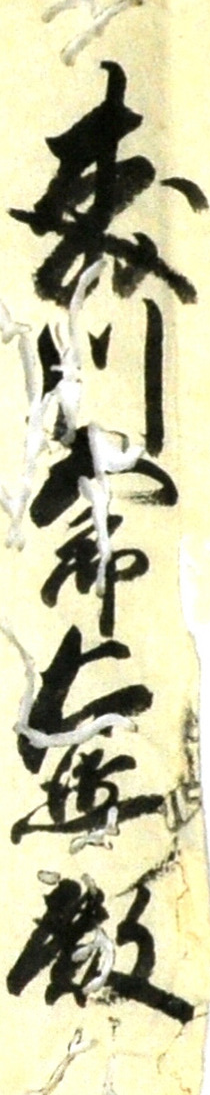森川五郎右衛門殿
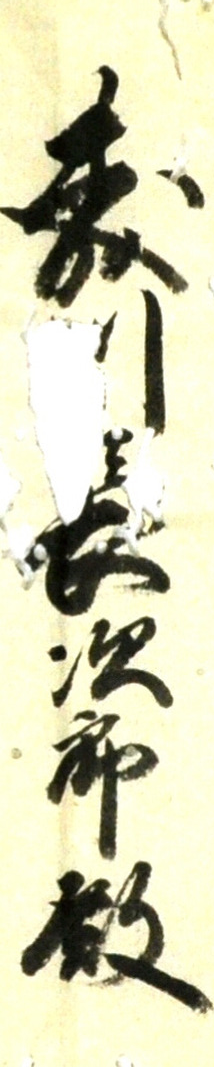森川長次郎殿
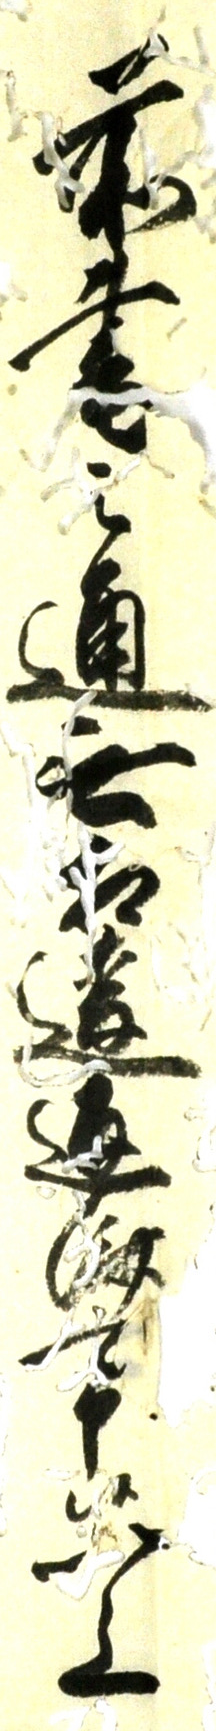前書之通無相違返済可申候以上
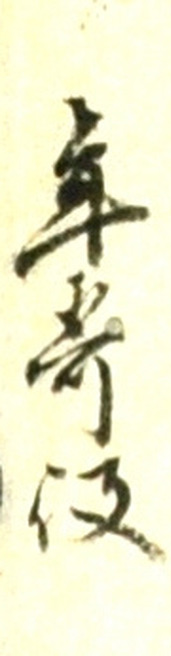年寄役
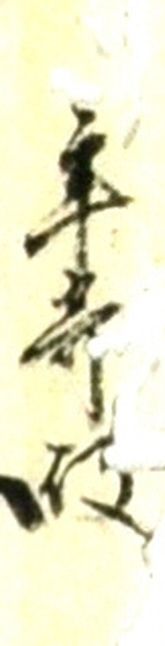年寄役
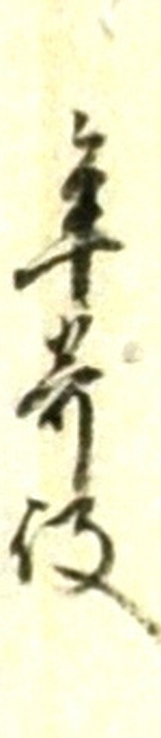年寄役
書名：添証文之事
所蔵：伊那市立高遠町図書館・合同会社AMANE
